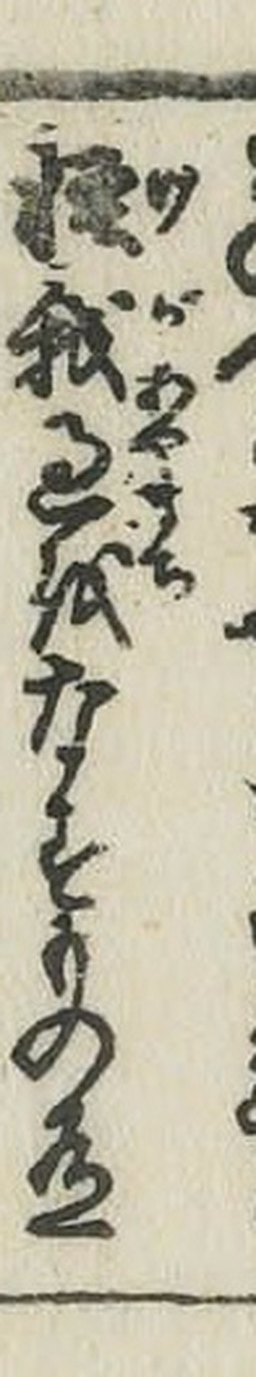怪我過をなすもの有
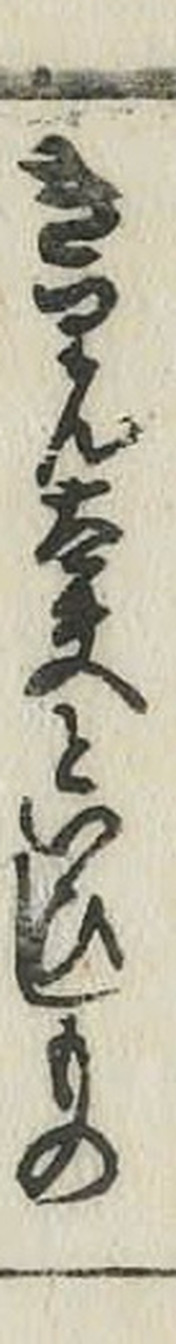きりん太夫といひしもの
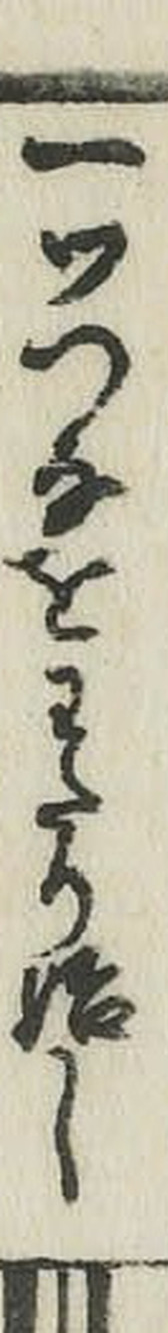一ツつなをわたり始し
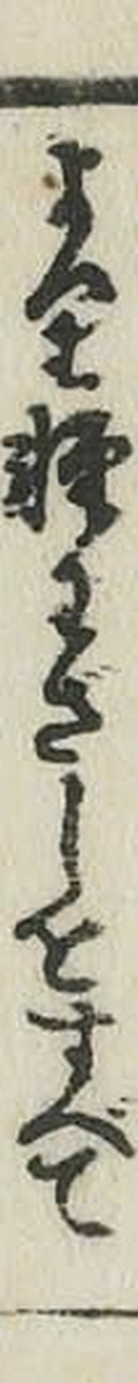より軽わざしをすべて
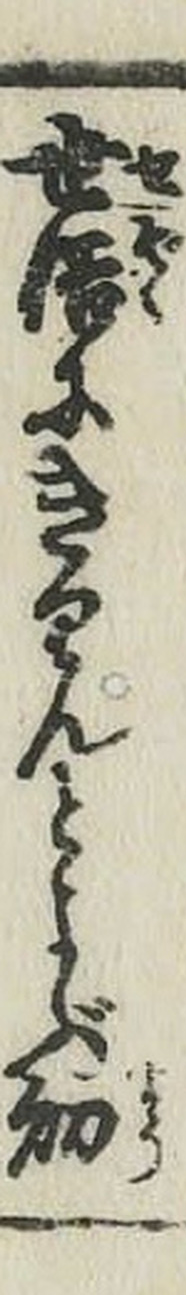世俗にきりんとよぶ幼
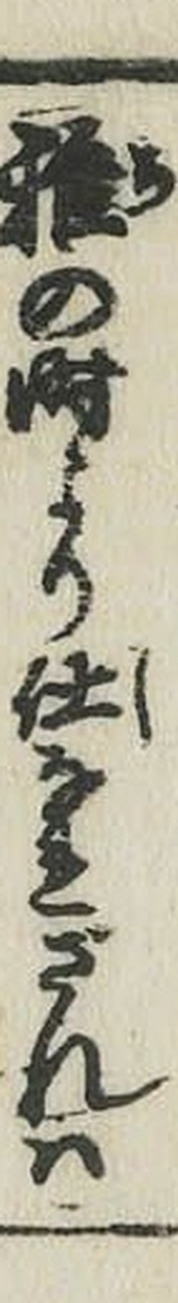稚の時より仕なれざれは
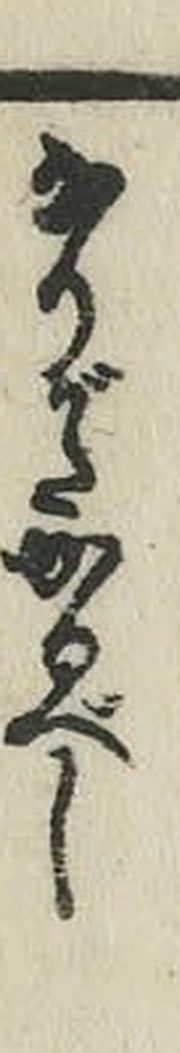なりがたかるべし

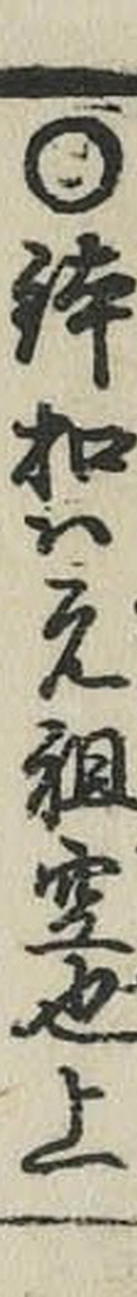○鉢扣は元祖空也上
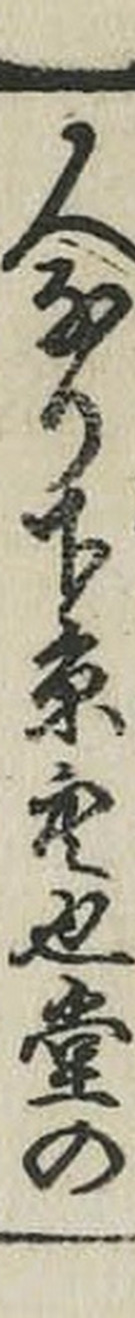人なり下京空也堂の
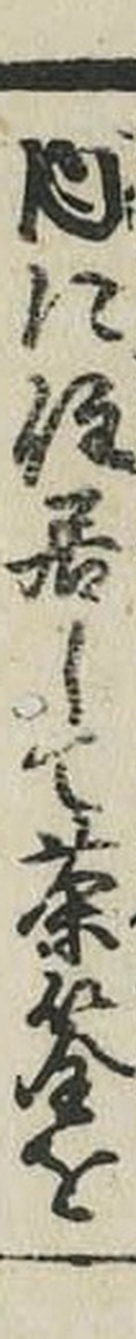内に住居して茶筌を
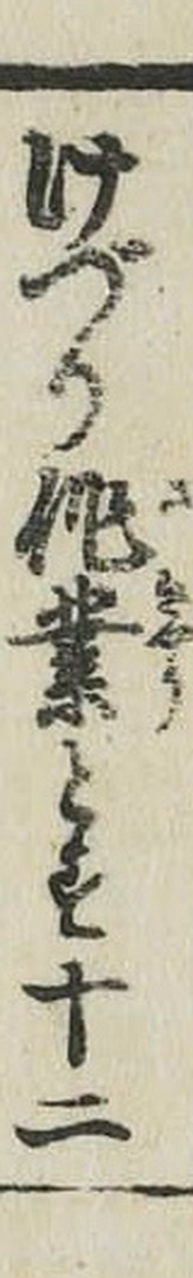けづり作業とす十二
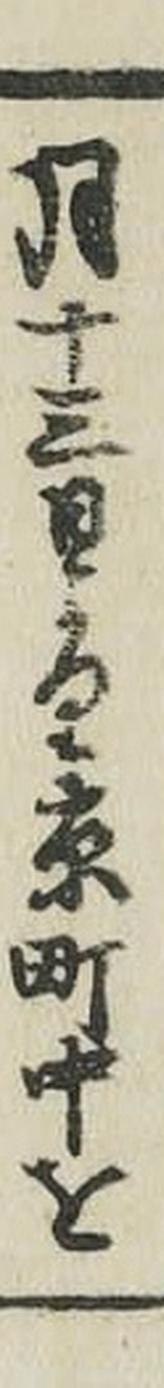月十三日より京町中を
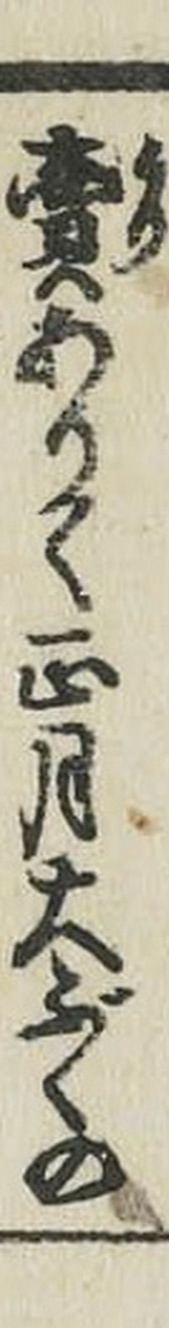売ありく正月大ぶくの
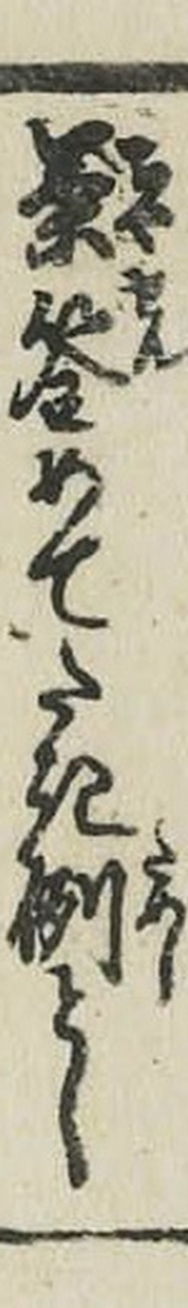茶筌めてたき例とし
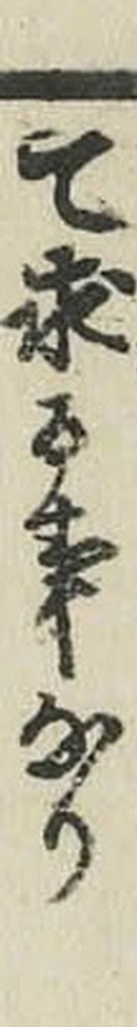て求る事なり
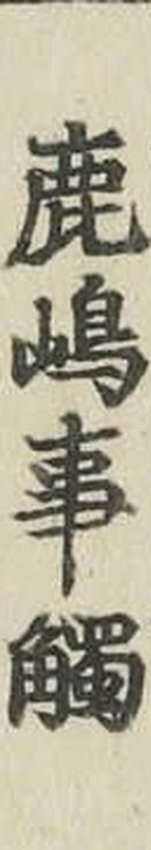鹿島事触
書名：増補頭書訓蒙図彙大成 10巻 10:巻之21
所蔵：東京学芸大学教育コンテンツアーカイブ
